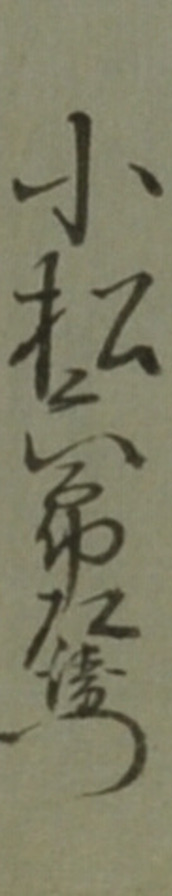小松六郎左衛門
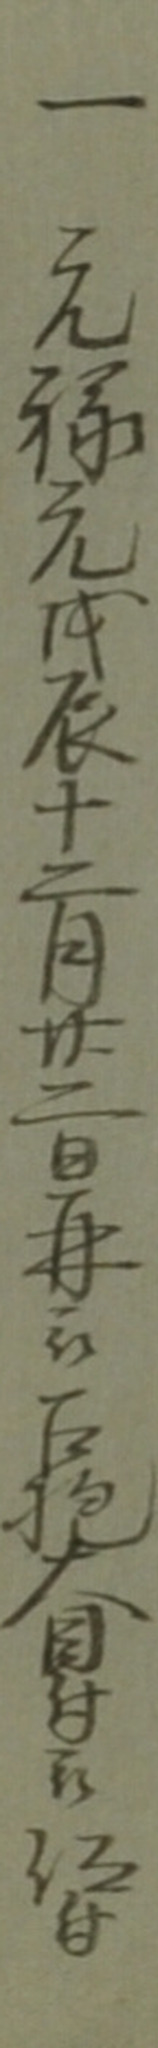一元禄元戊辰十二月廿二日再被召抱大目付被仰付
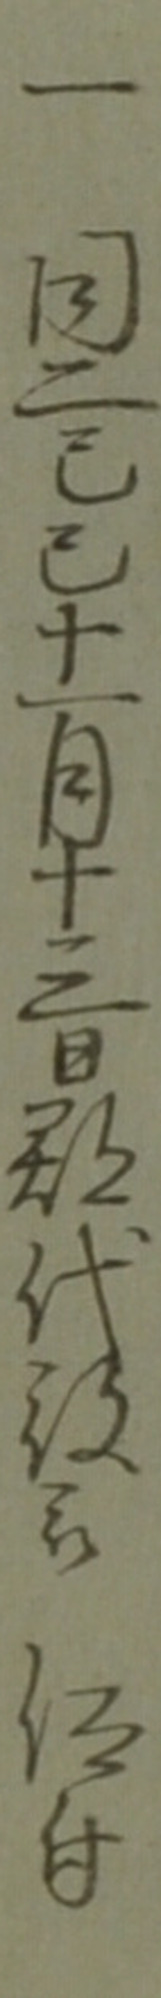一同二己巳十一月十三日郡代役被仰付
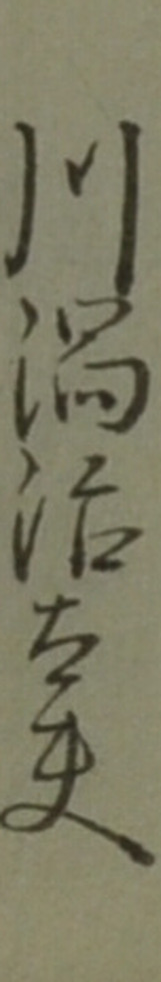川鍋治太夫
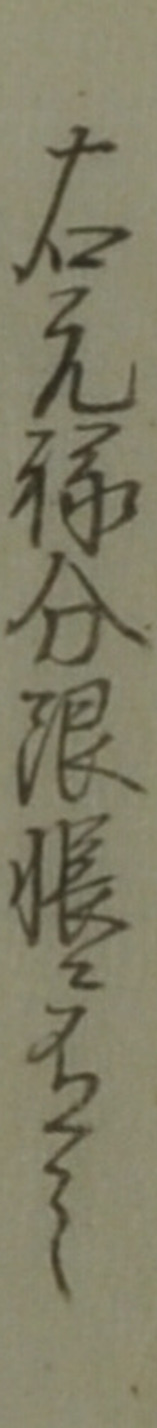右元禄分限帳ニ有之
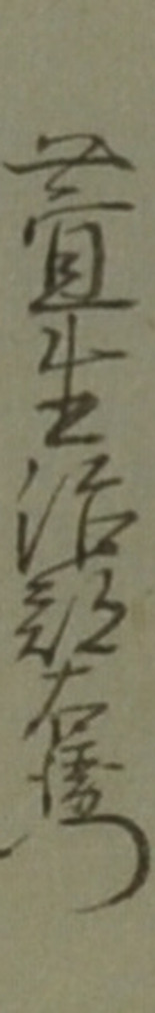萱生治部右衛門
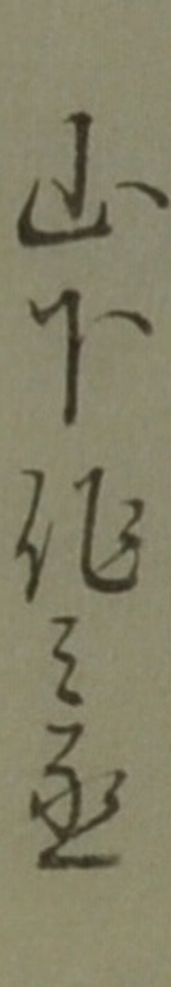山下作之丞
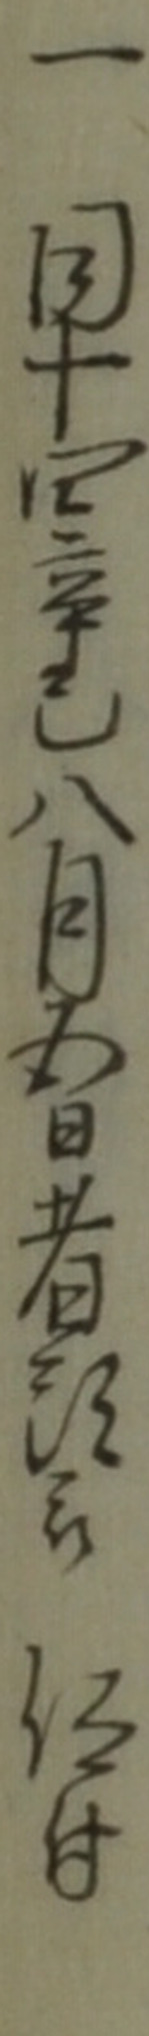一同十四辛巳八月五日者頭被仰付
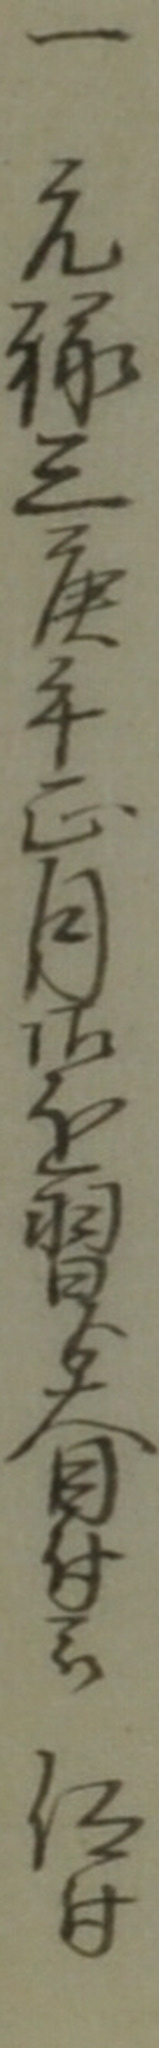一元禄三庚午正月御近習ゟ大目付被仰付
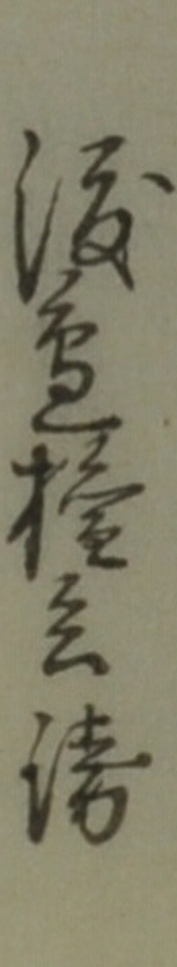渡邊権兵衛
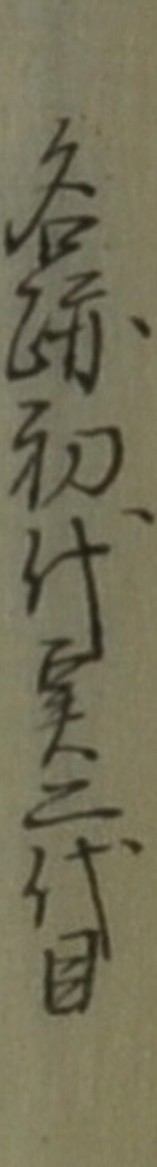名跡初代実二代目
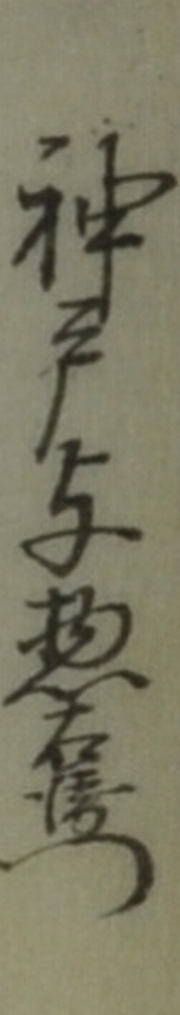神戸与惣右衛門
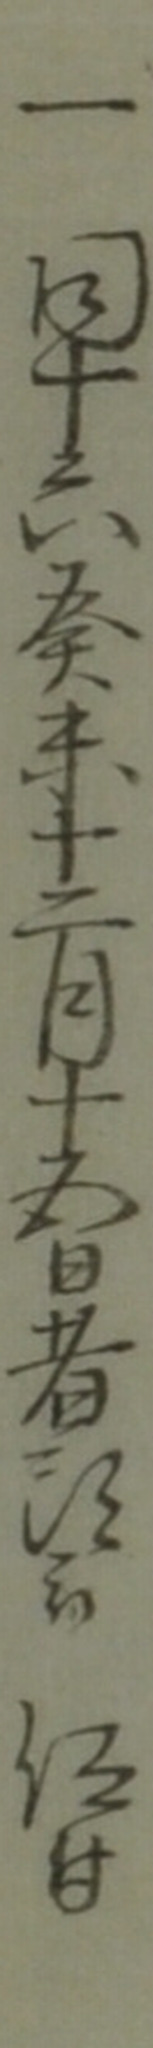一同十六癸未十二月十五日者頭被仰付
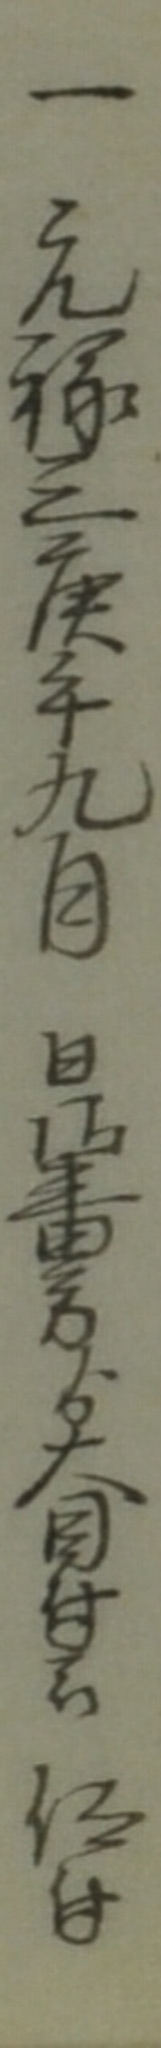一元禄三庚午九月日御番方ゟ大目付被仰付
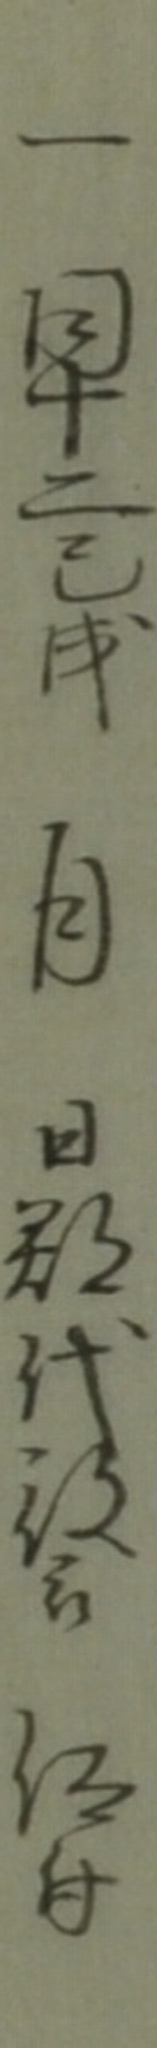一同十二己戌月日郡代役被仰付
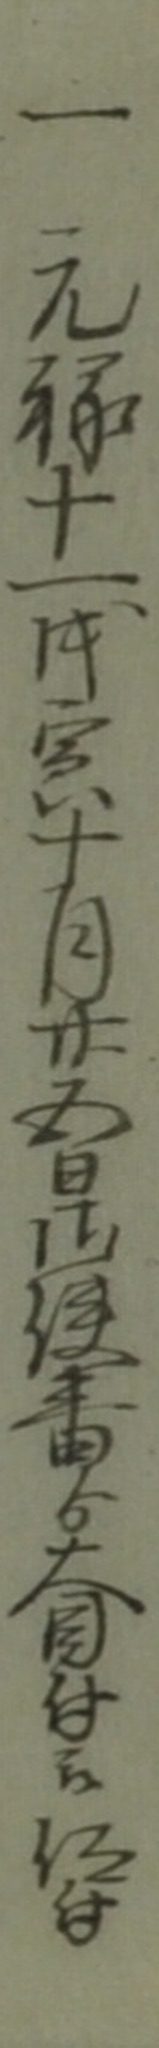一元禄十一戊寅十月廿五日御使番ゟ大目付被仰付
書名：諸御役代々録（三）
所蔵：伊那市立高遠町図書館・合同会社AMANE
